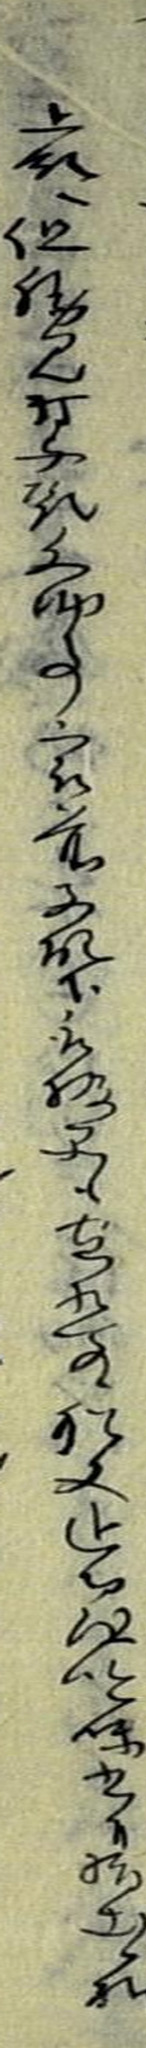上領へ但勝見村与頭文助事最前支配下取扱品も宜相聞候猶又追而致吟味書付指出候様
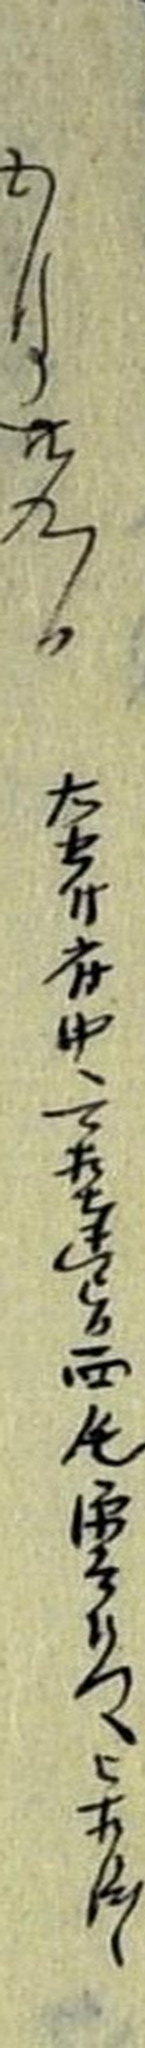五月廿九日右書付府中へ可相達旨西尾源太左衛門へ被相渡候
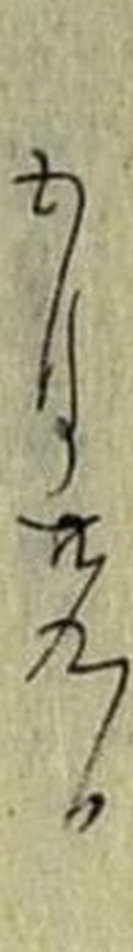二月廿一日
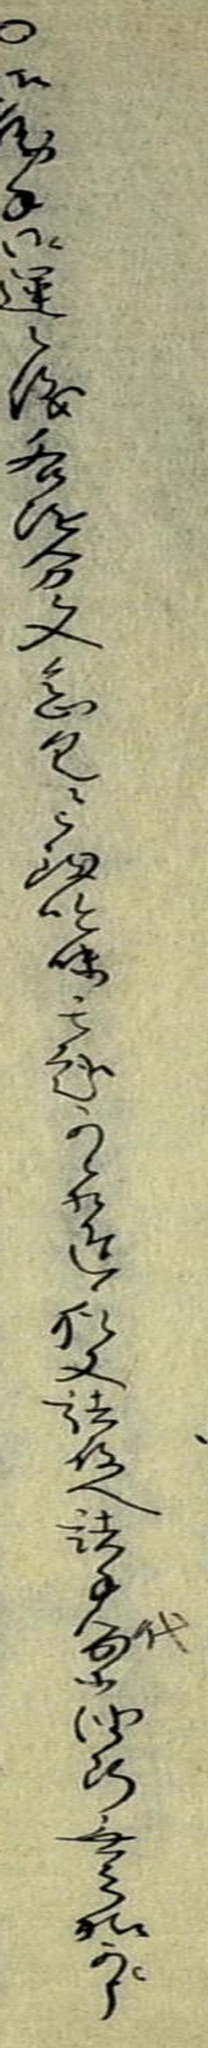〇御勝手御運之儀各随分ニ入念具ニ被致吟味其趣可被相達候猶又諸役人諸手代ゟ少油断無之様可被申
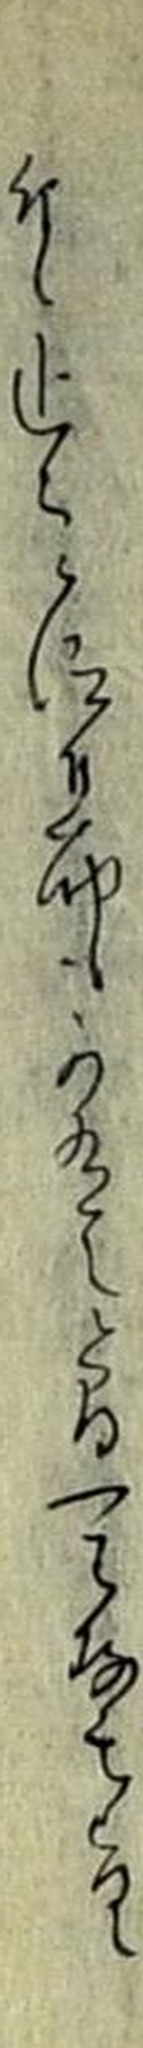付候追々被仰付筋も可有之候間可被存其旨候
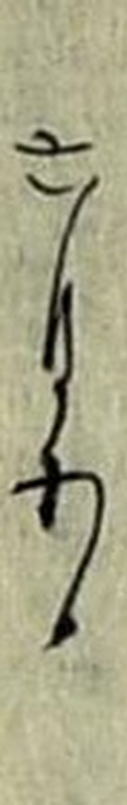六月五日
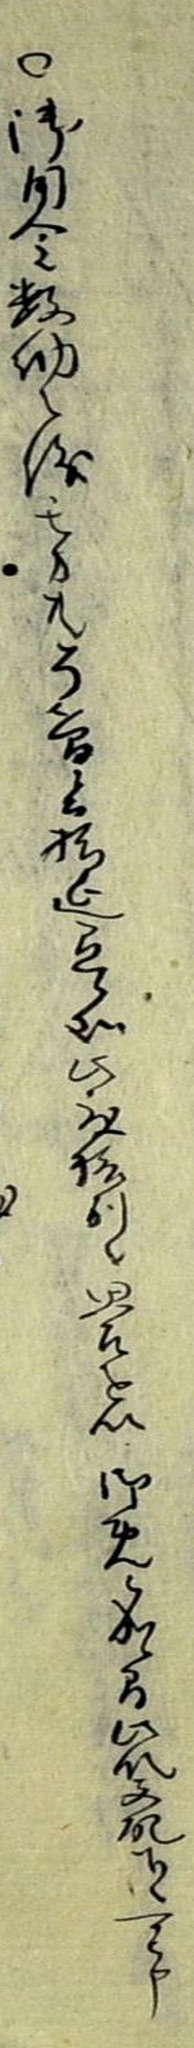〇御用金数納之儀其方共了簡ニ而指延置候処此度格別之思召を以御免被成候間此段支配下へ可被申
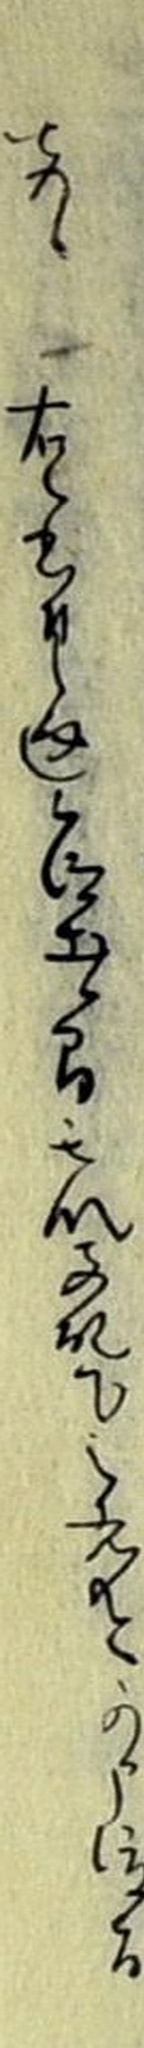聞候右之書付之通被仰出候間其段支配下之者共へ可申渡旨

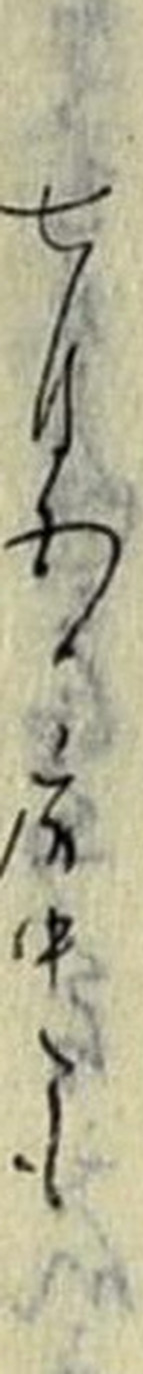七月五日府中へも
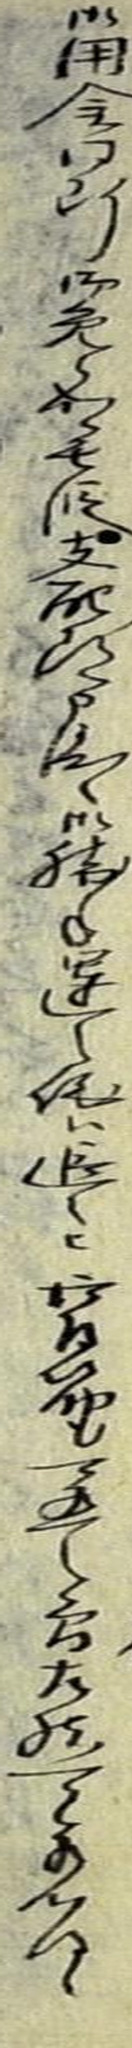〇御用金同断御免被成候其段支配頭へ申渡候御勝手運之儀ハ追々被仰付筋も可有之候間左様可被相心得候
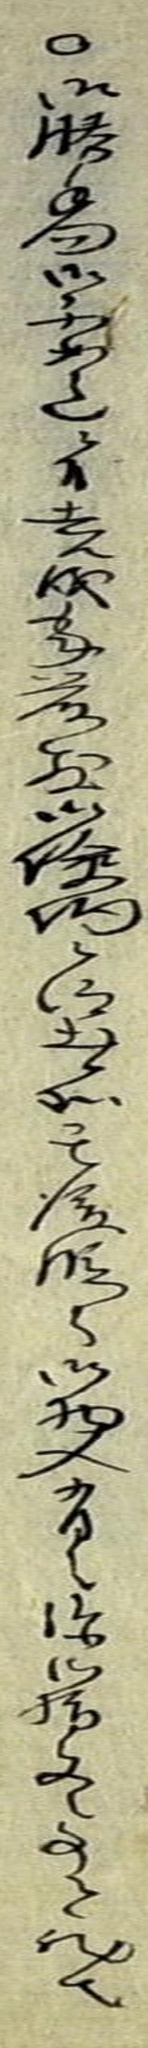〇御勝手向御不如意ニ付去ル戌年厳敷御倹約被仰出候処其後段々御物入有之弥御指支之事ニ候然者
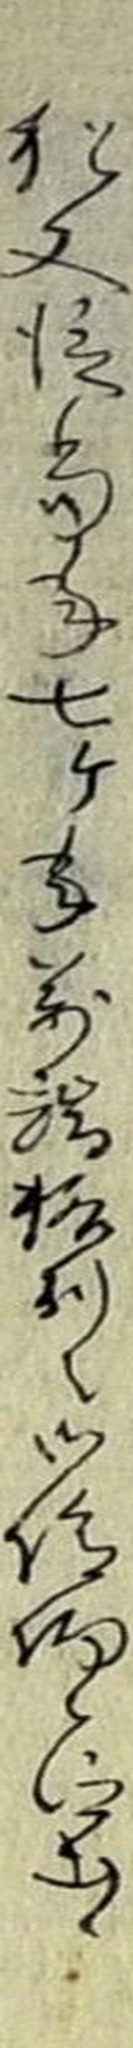猶又従当年七ケ年万端格別之御倹約被仰出候
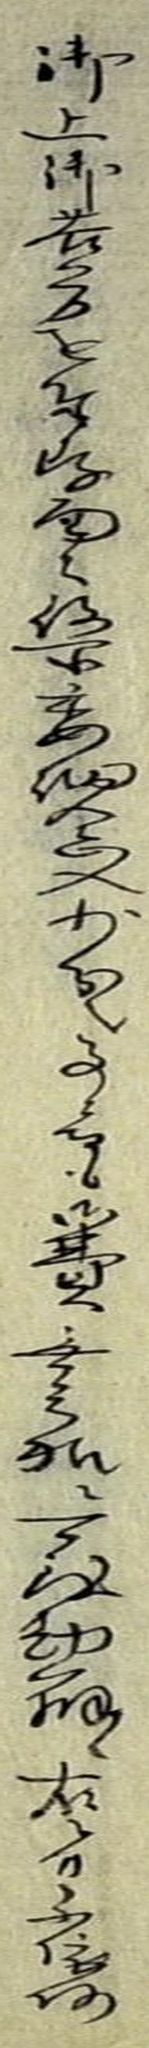御上御苦労を奉存面々役所委細念入少分之事ニ而も御費無之様ニ可致勘弁候右ニ付不依何
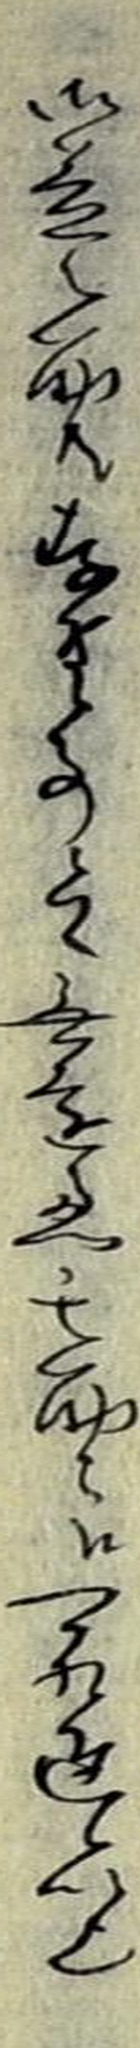御益之筋共存付候事候ハヽ無遠慮其筋々江可相達候以上
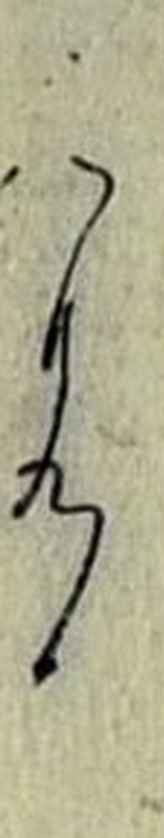八月九日
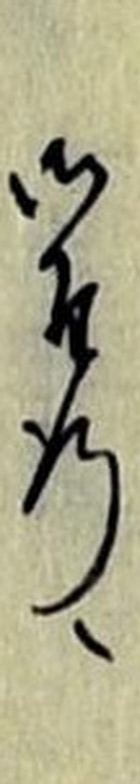御奉行へ
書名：命令之部 一
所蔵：福井県文書館 Fukui Prefectural Archives
